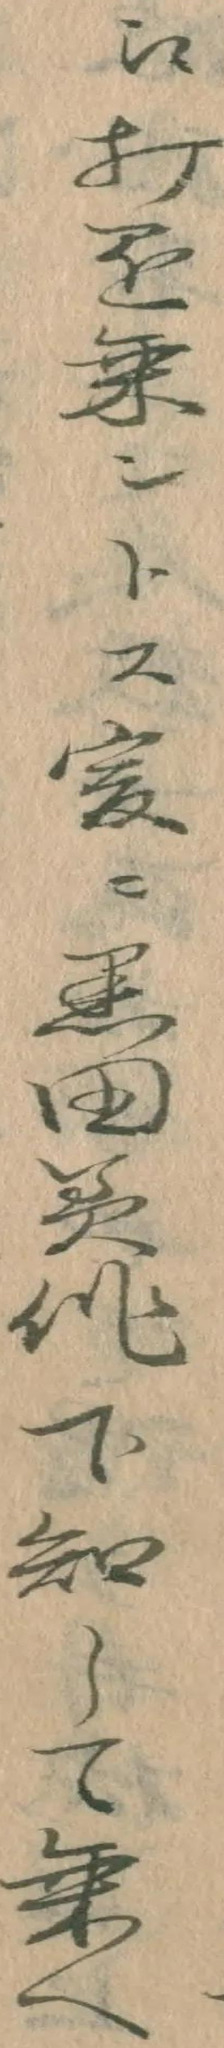江打懸乗しとす爰に黒田美作下知して乗へ
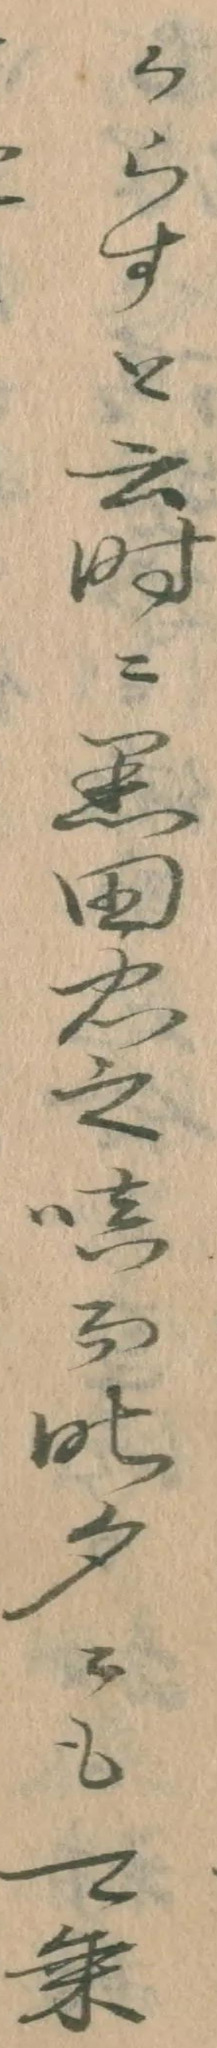からすと云時に黒田忠之晴而昨夕にも可乗
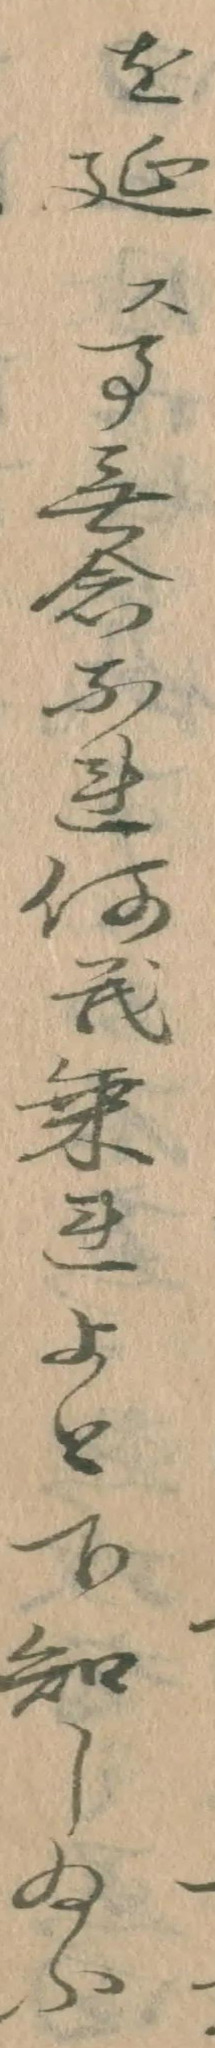を延す事無念な連何茂乗連よと下知しゐふ
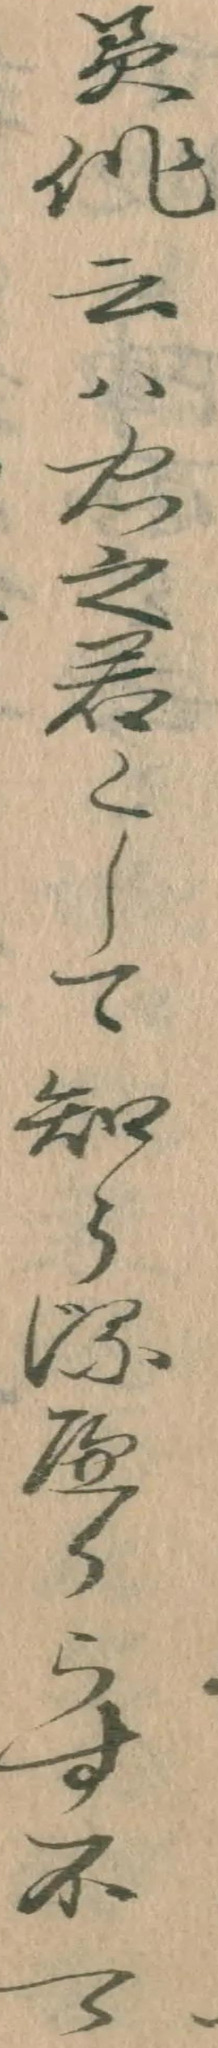美作云は忠之若くして知ら津扁りらす不可
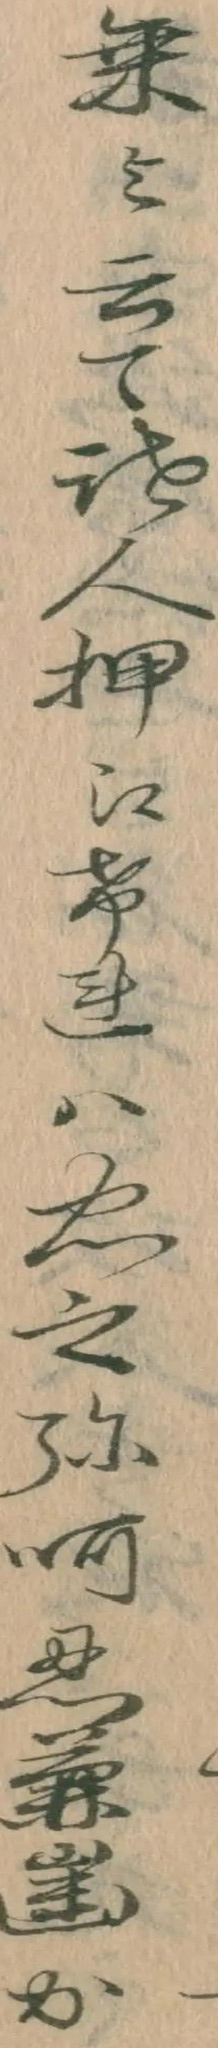乗与云て諸人押江希連は忠之弥呵忍兼歯か
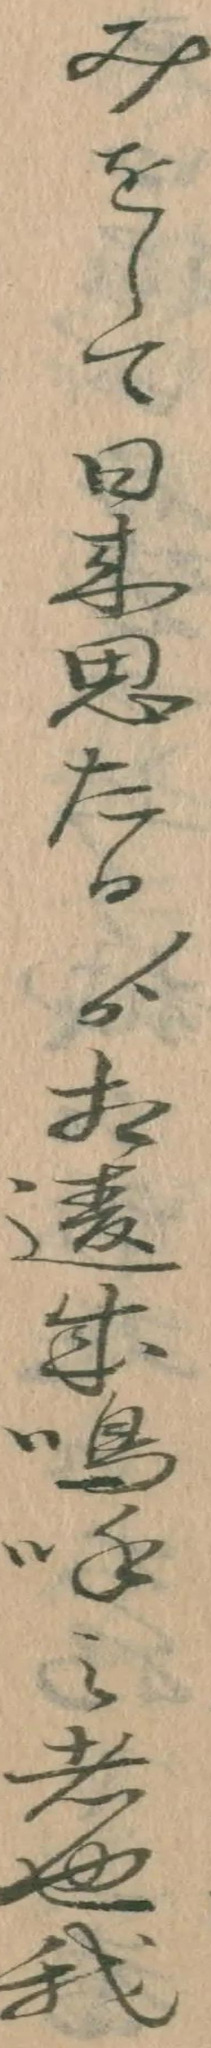みをして日来思たるゟ相違成鳴呼之者也我
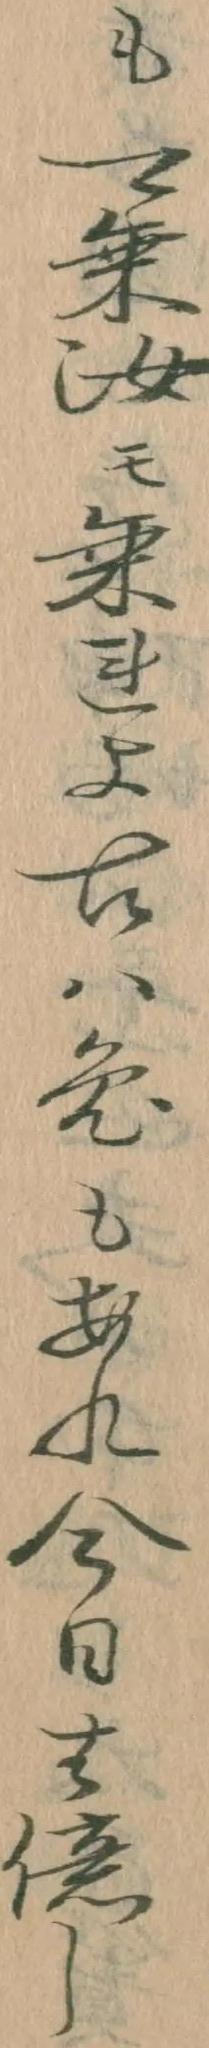も可乗汝も乗連よ古は兎もあれ今日者億し
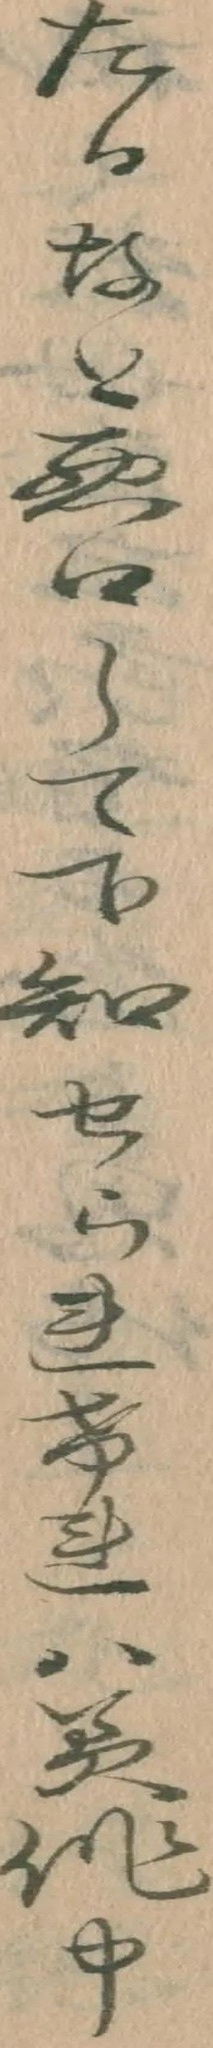たるなと悪口して下知せら連希連は美作申
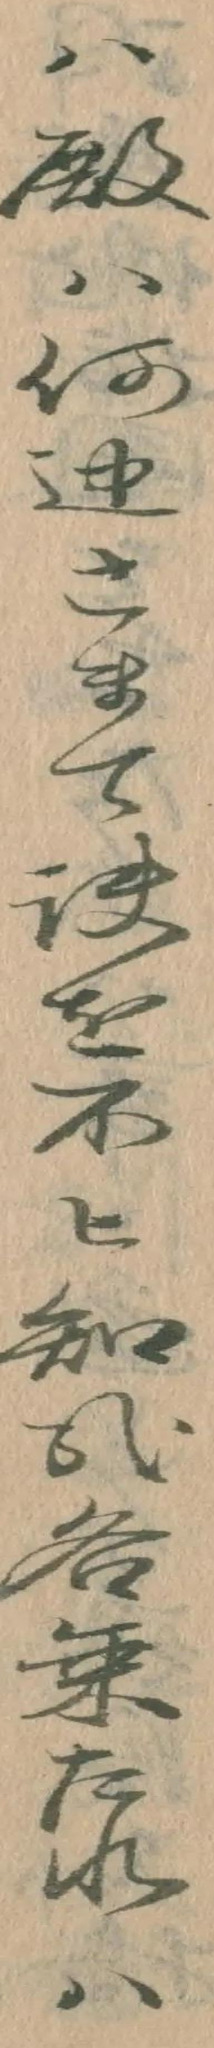は殿は何迚さまて決を不被知哉各乗たれは
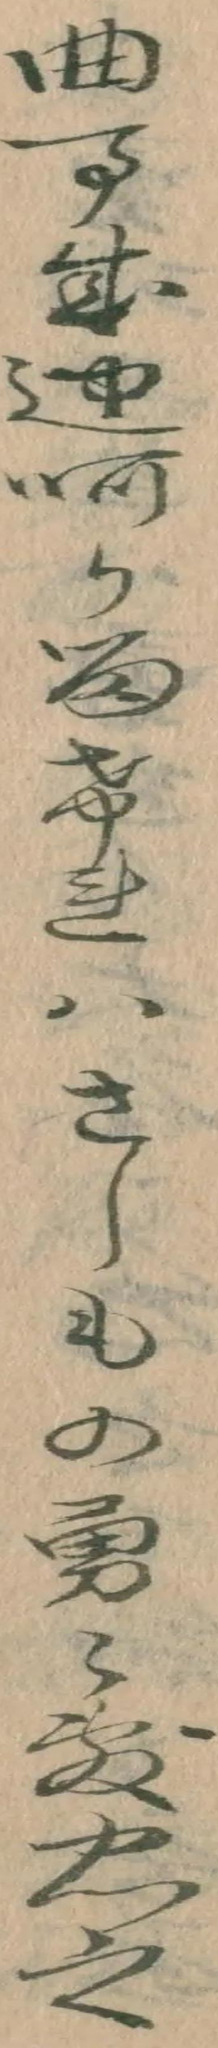曲事成迚呵か留希連はさしもの勇々敷忠之
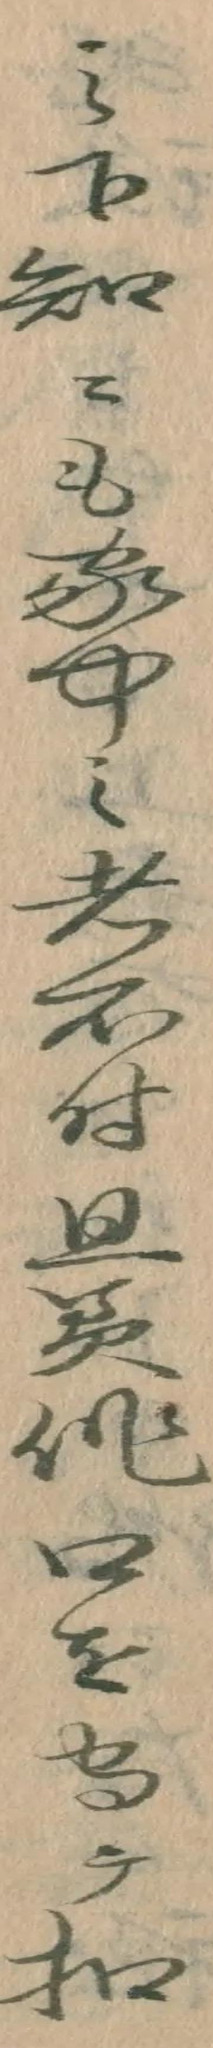之下知にも家中之者不付且美作口を守て扣
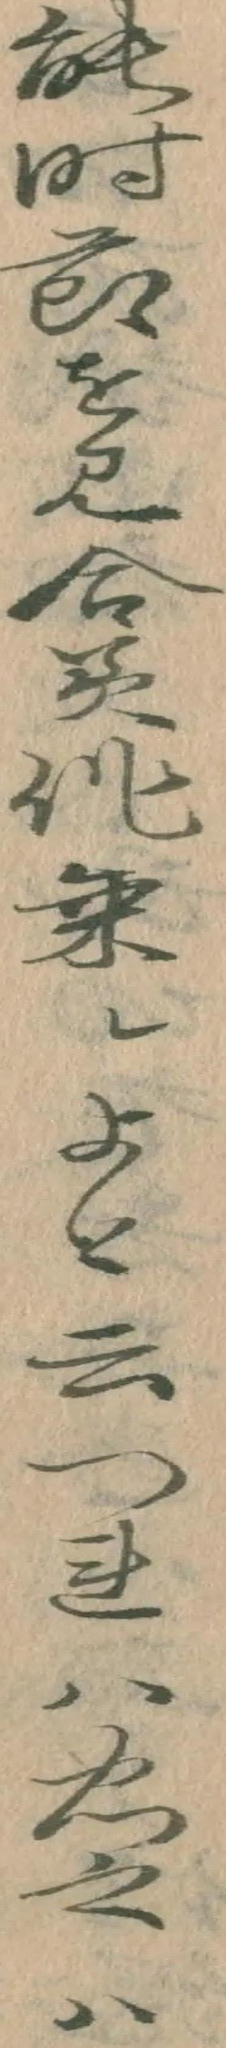能時節を見合美作乗れよと云つ連は忠之は
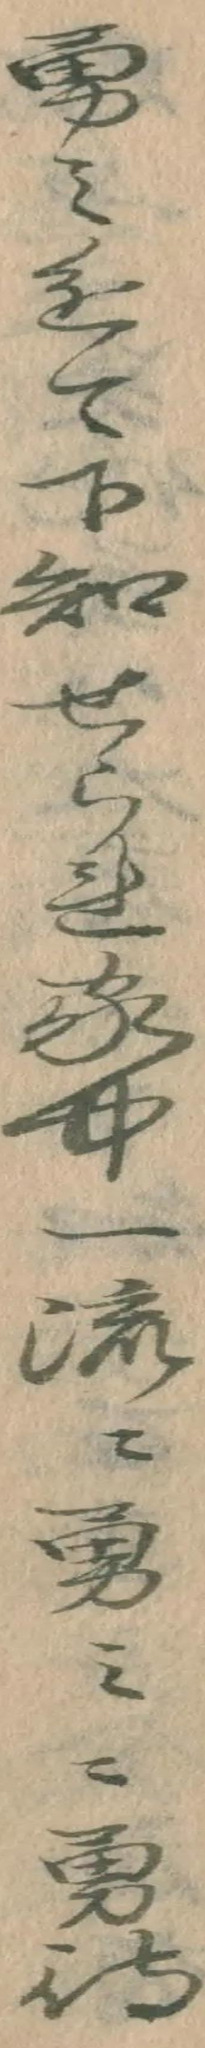勇み進て下知せら連家中一流に勇みに勇待
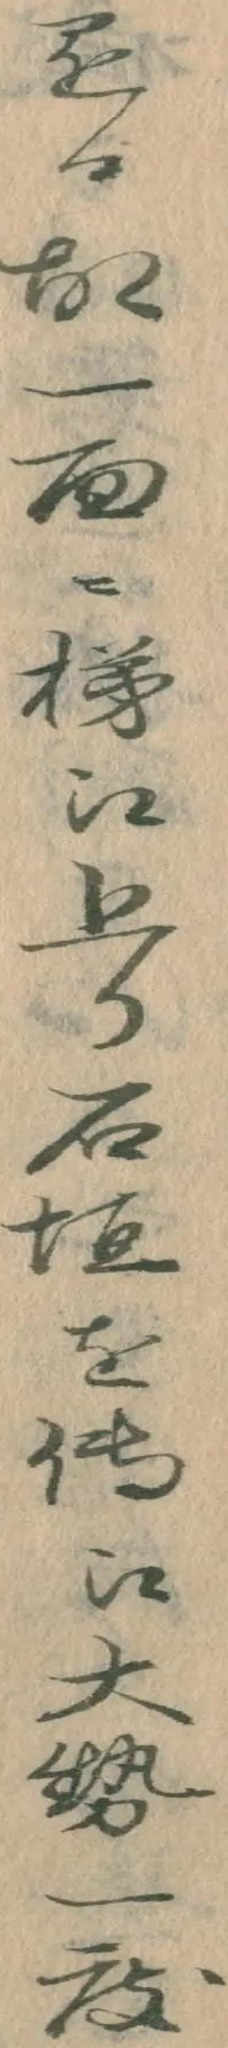懸る故一面に梯江上り石垣を伝江大勢一度
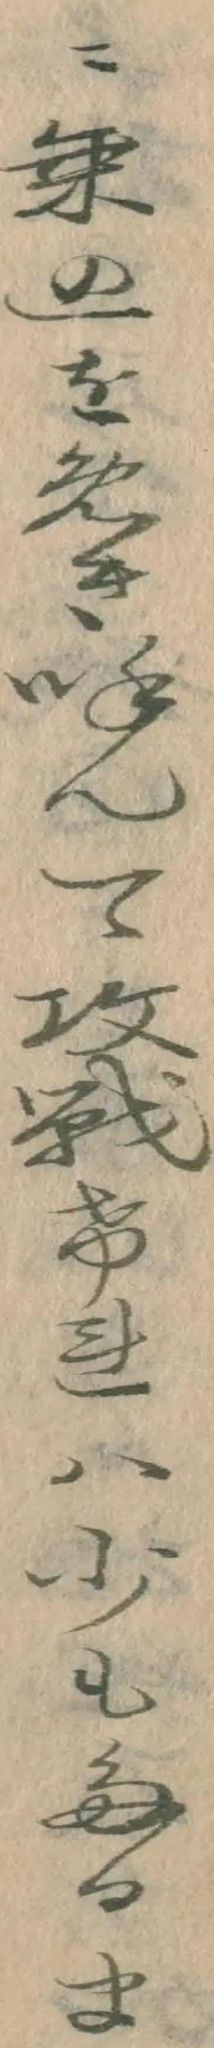に乗込を免き呼んて攻戦希連は少も多るま
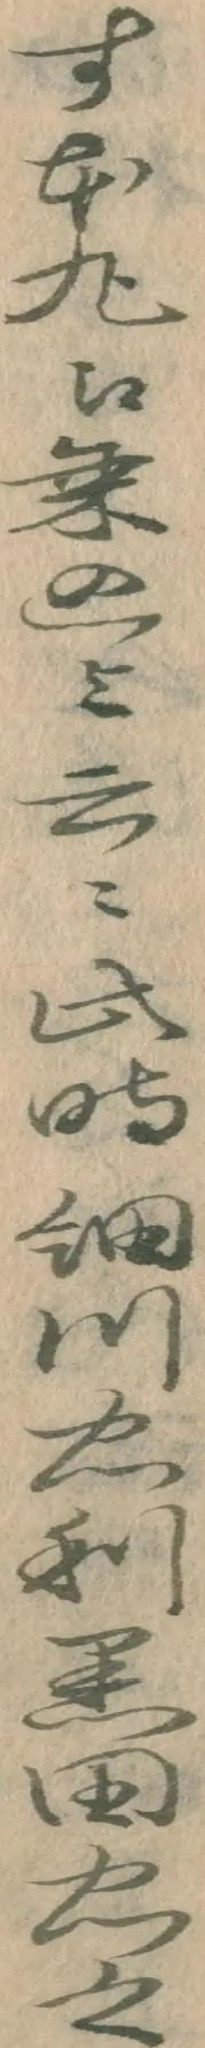す本丸江乗込与云々此時細川忠利黒田忠之
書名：切支丹御退治記 49巻. [7]
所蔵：国立国会図書館 National Diet Library, JAPAN
